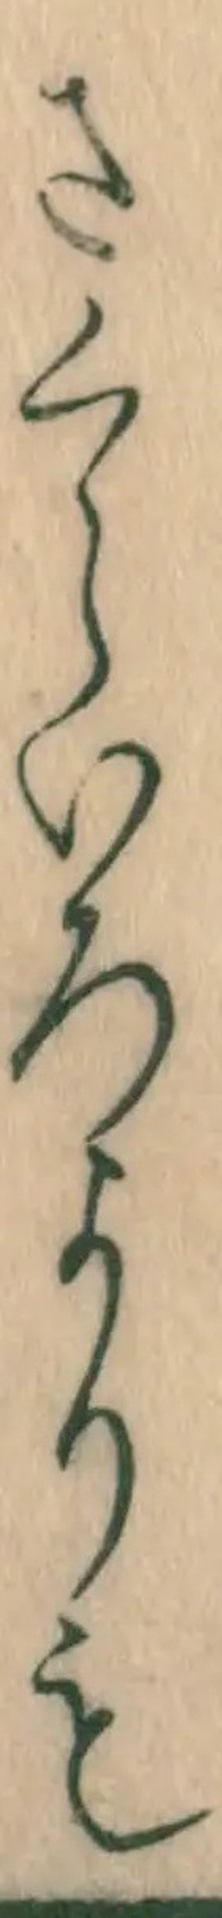さくらいろよりも
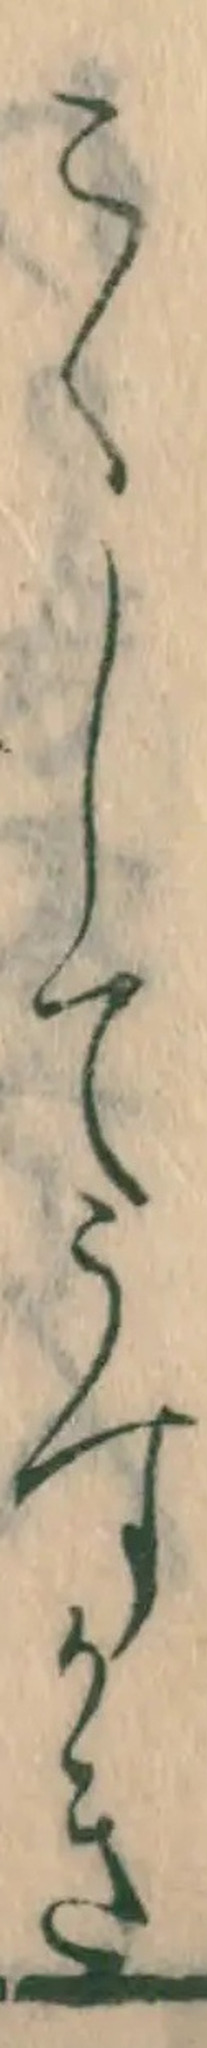こくしてうすかき
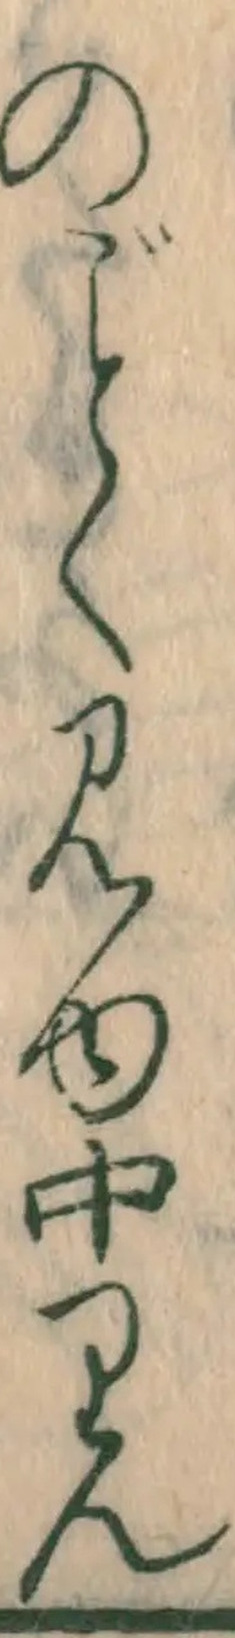のごとく見ゆ中りん
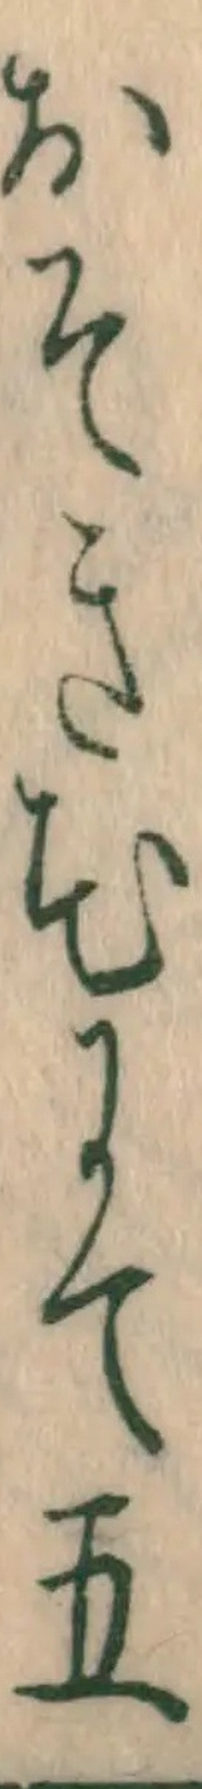おそき花にて五
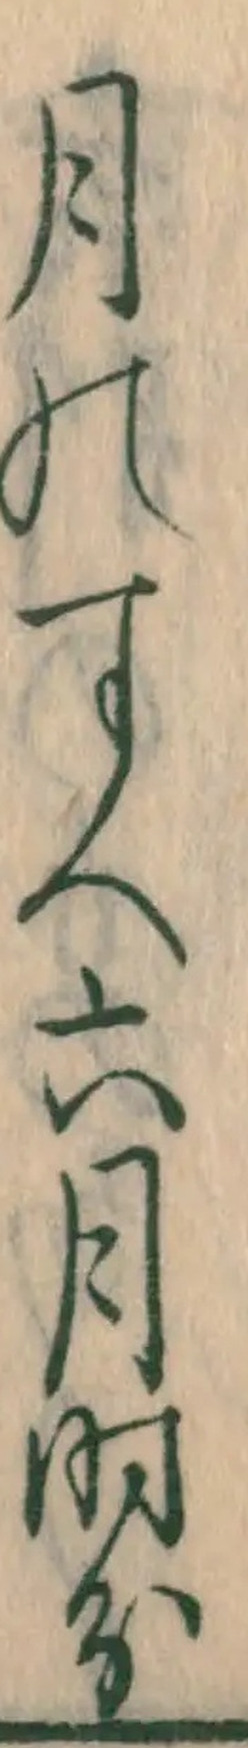月のすへ六月時分
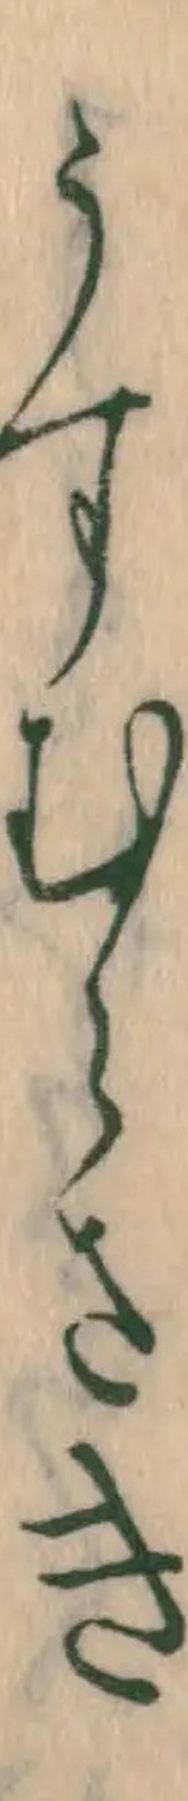うすむらさき
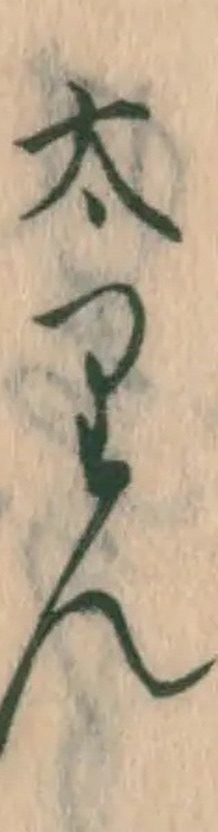太りん
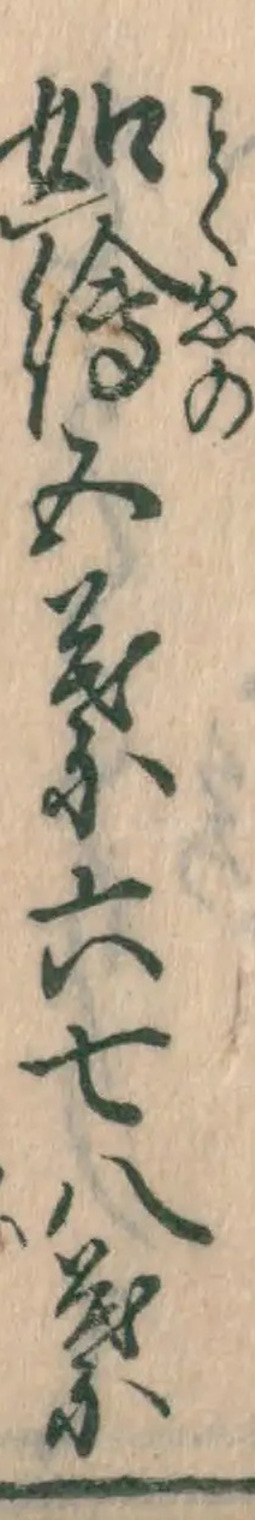如絵五葉六七八葉
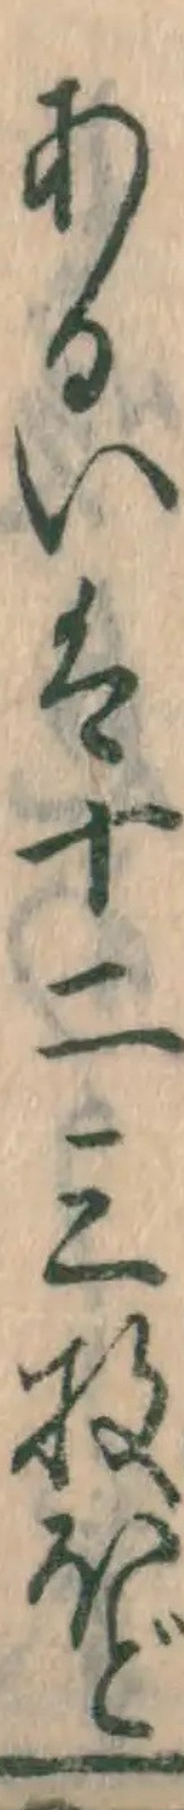あるいは十二三枚ほど

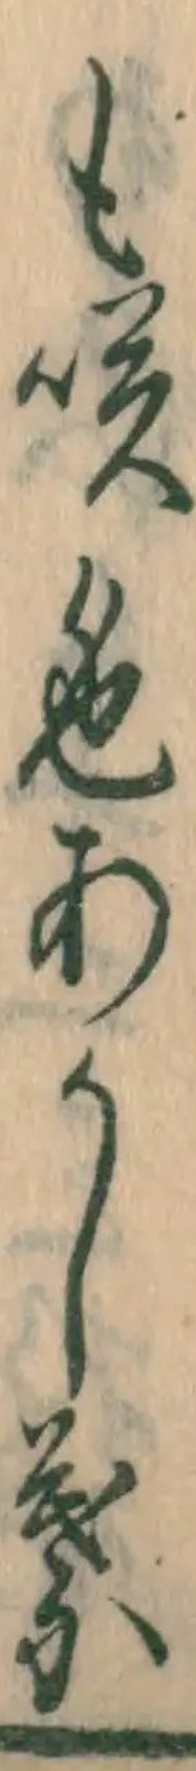も咲色あかし葉
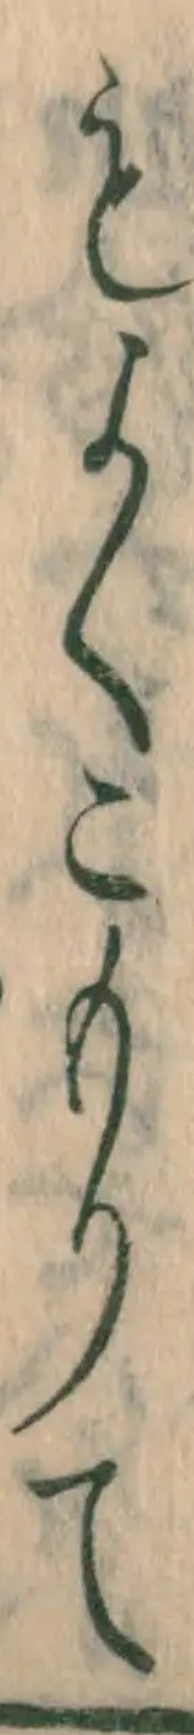もよくこもりて
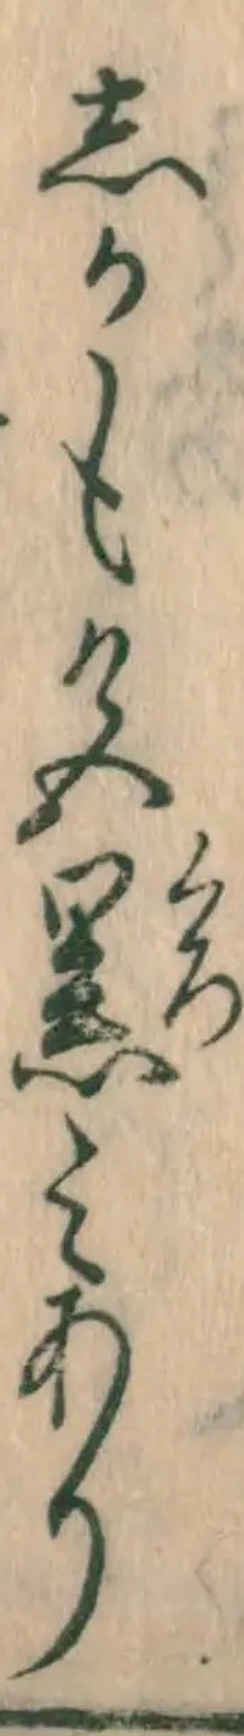しかも色黒みあり
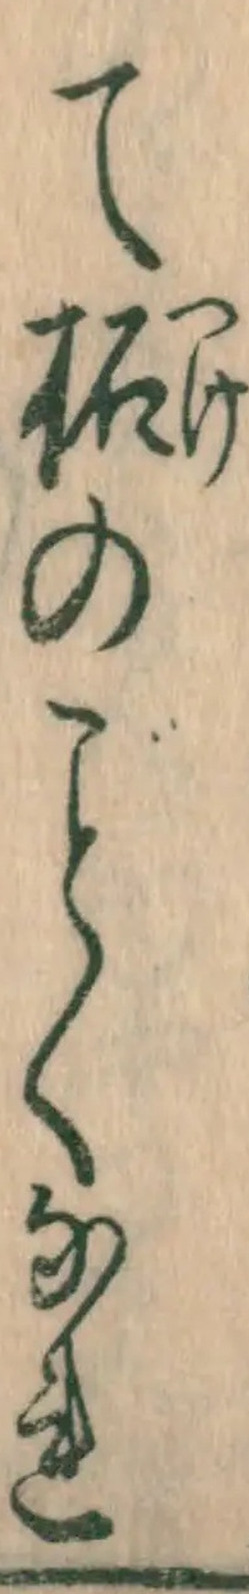て柘のごとくなれ
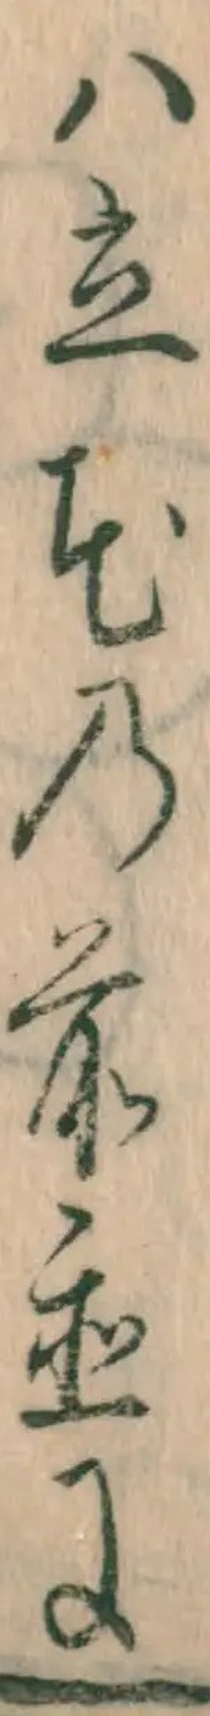は立花の前置に
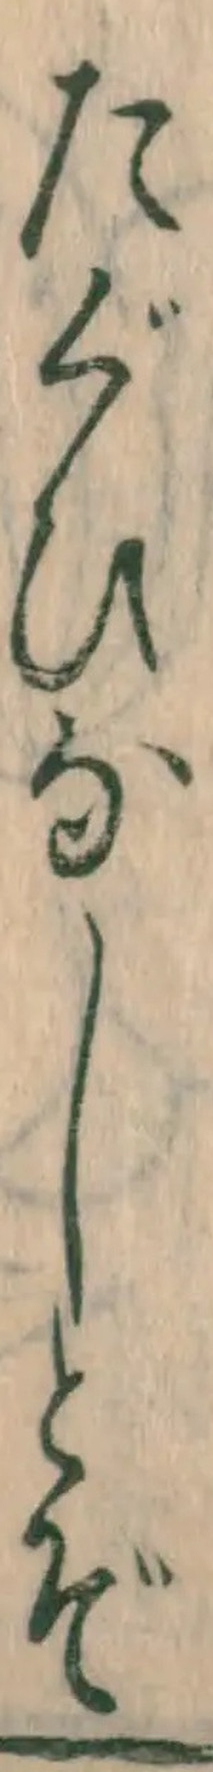たぐひなしとぞ
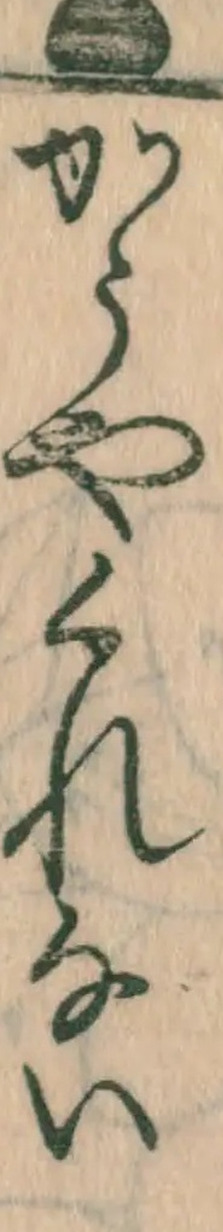●かうやくれない
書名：錦繍枕 5巻. [4]
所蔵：国立国会図書館 National Diet Library, JAPAN
